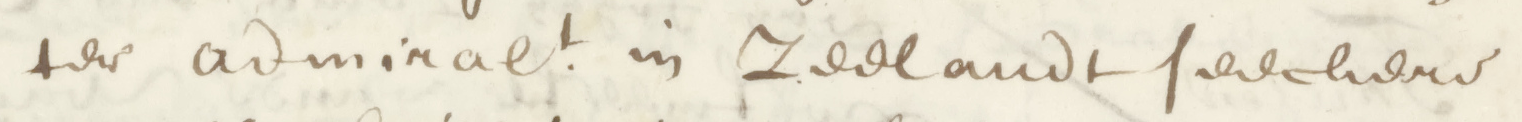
ter Admiralt. in Zeelandt seeckere
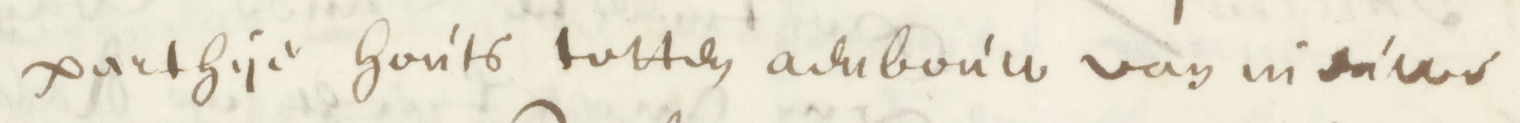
parthije houts totten aenbouw van nieuwe
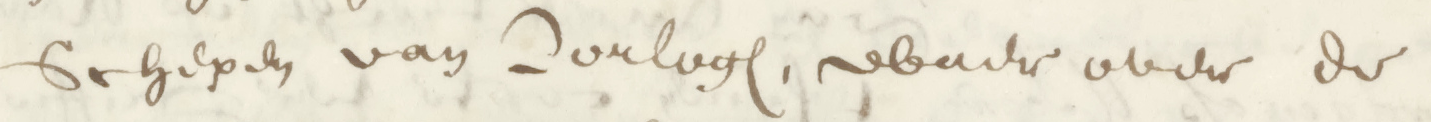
Schepen van Oorlogh, waer over de
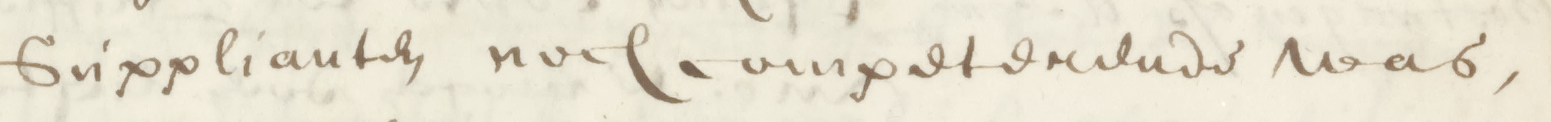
Supplianten noch competerende was,
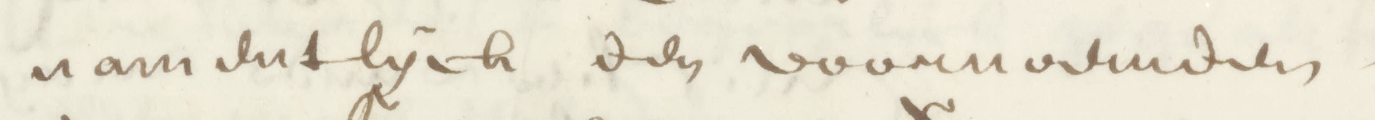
namentlijck den voornoemden
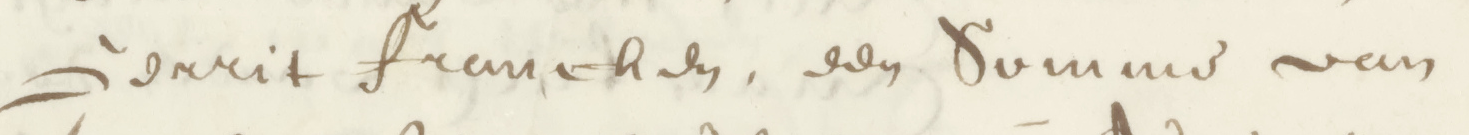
Gerrit Francken, een Somme van
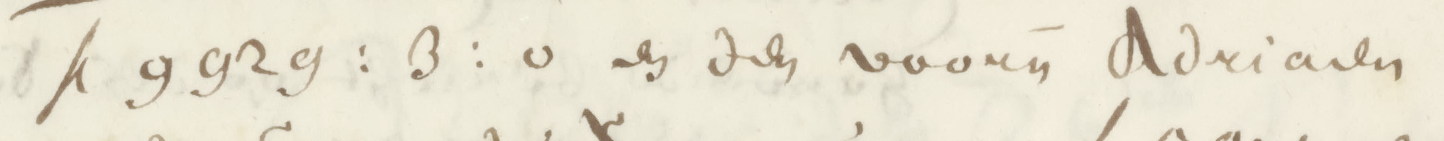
fl 9929: 3: 0 en den voorn Adriaen
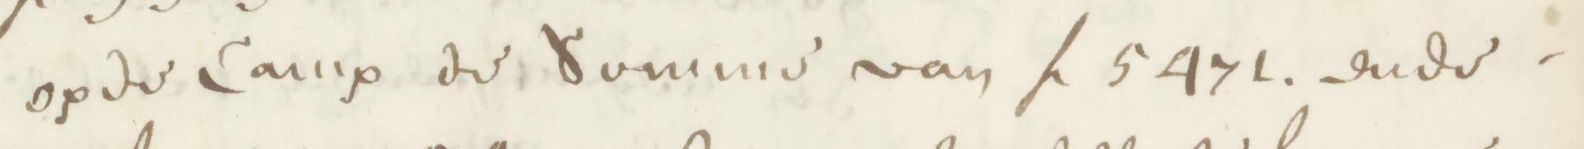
opde Camp de Somme van fl 5471. ende
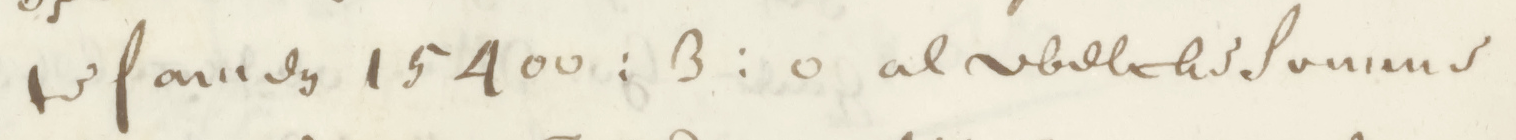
tesamen 15400 :3 :0 al welcke somme
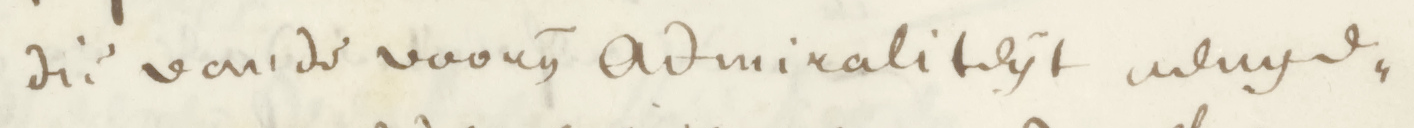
die vande voorn admiraliteijt aenge„
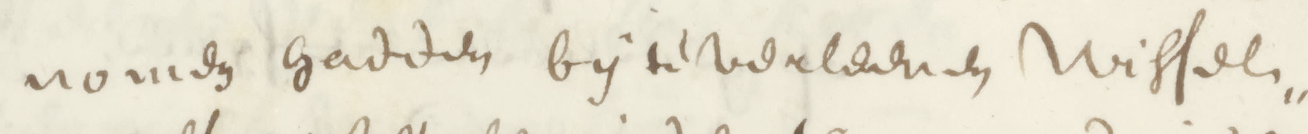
nomen hadden bij te verleenen wissel,,
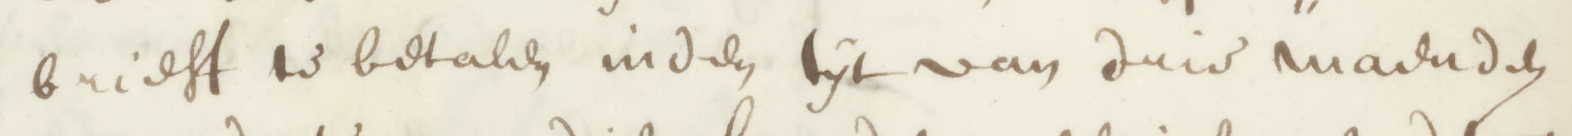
brieff te betalen inden tijt van drie maenden
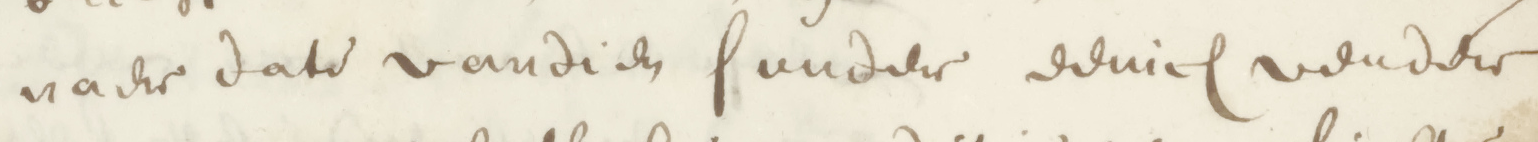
naer date vandien sonder eenich verder
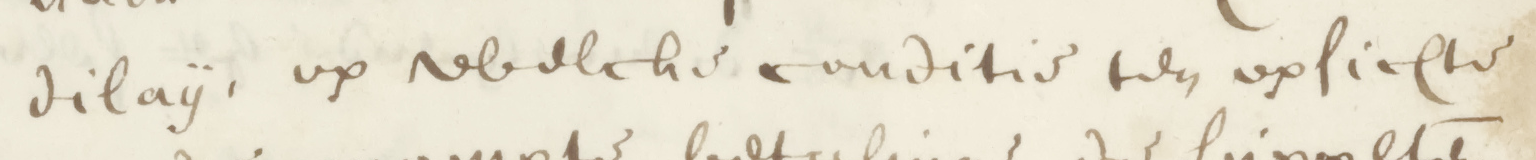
dilaij, op welcke conditie ten opsichte
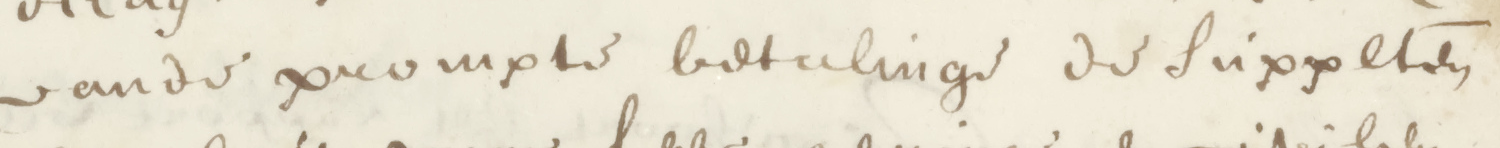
vande prompte betelinge de supplten
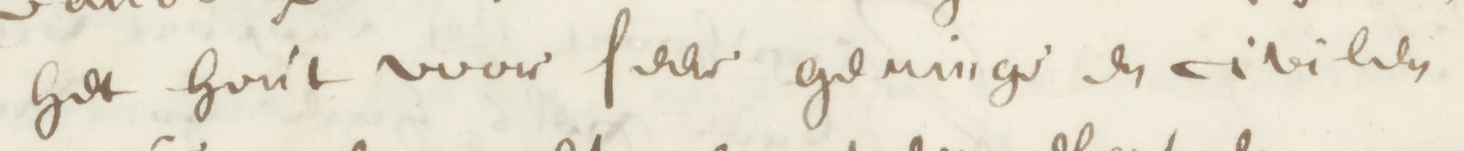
het hout voor seer geringe en civilen
